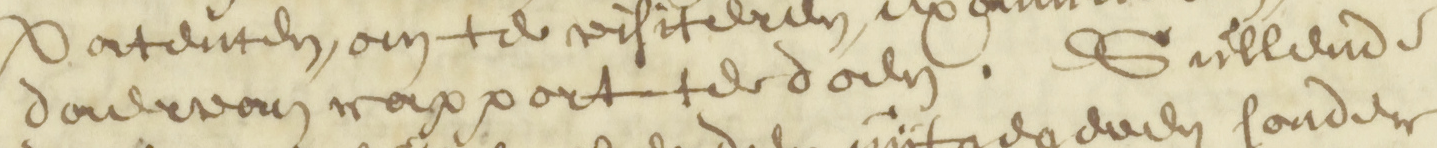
daervan rapport te doen. Sullende
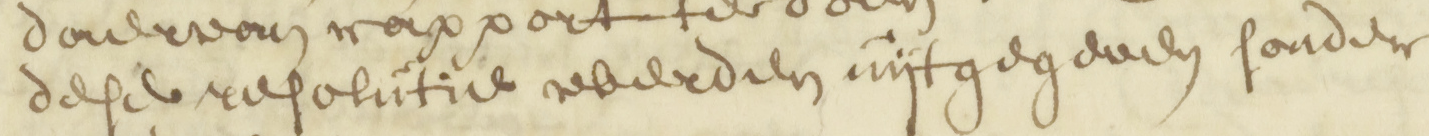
dese resolutie werden uijtgegeven sonder
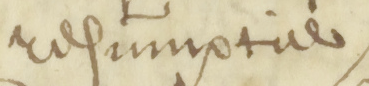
resumptie.
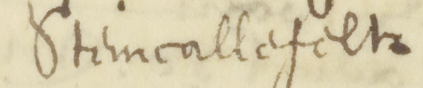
Steincallefeltz
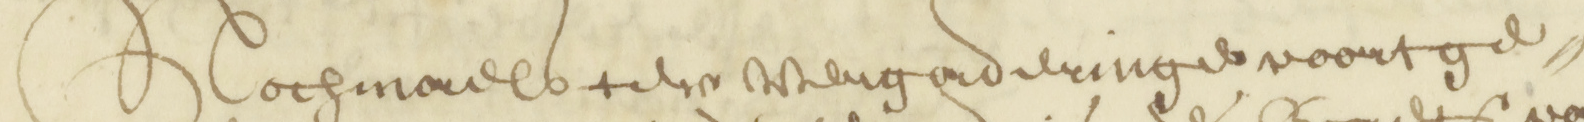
Nochmaels ter Vergaderinge voortge„
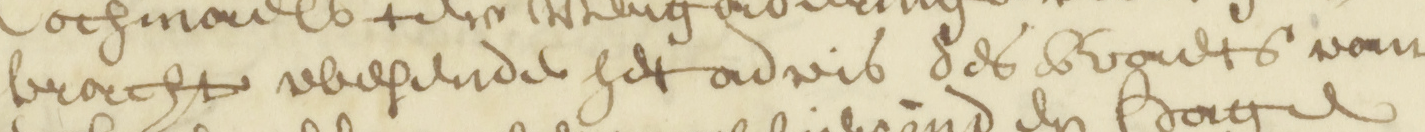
bracht wesende het advis des Raets van
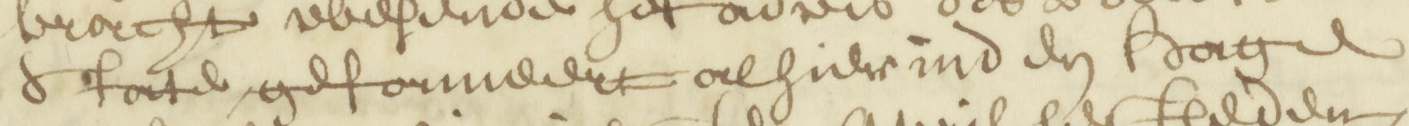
State, geformeert alhier inden Hage
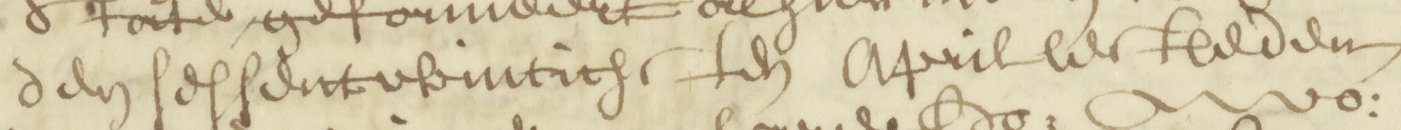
den sessentwintichsten April lestleden,
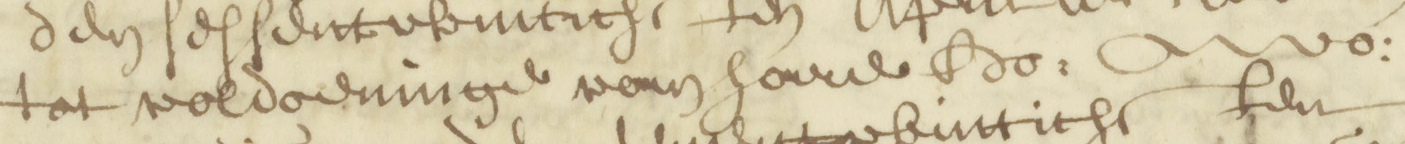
tot voldoeninge van hare Ho:Mo:
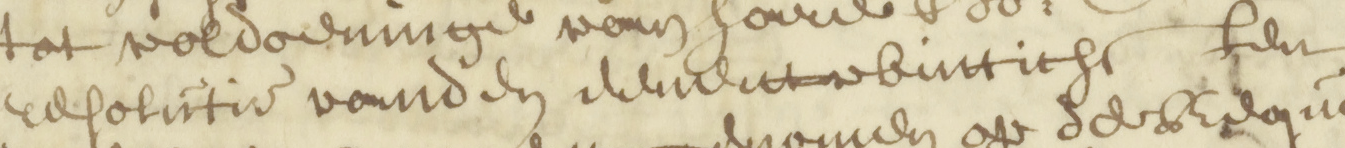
resolutie vanden eenentwintichsten
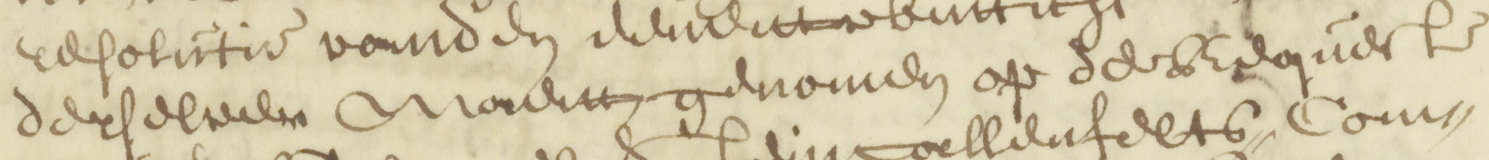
derselver Maent, genomen op de Requeste
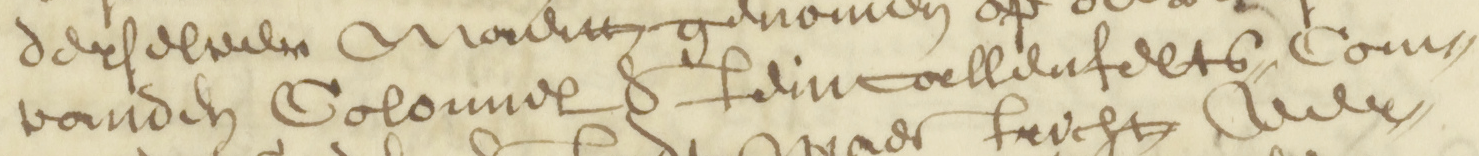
vanden Colonnel Steincallenfelts, Com„
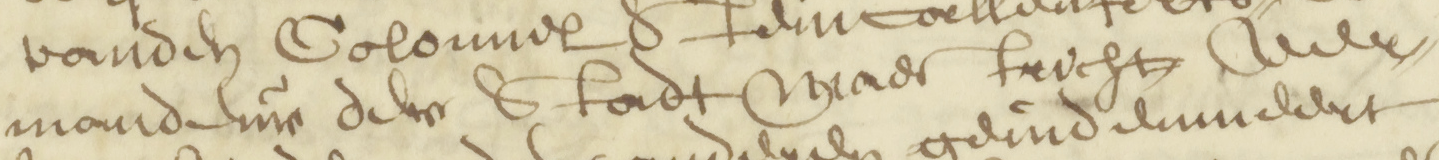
mandeur der Stadt Maestricht, Ver„
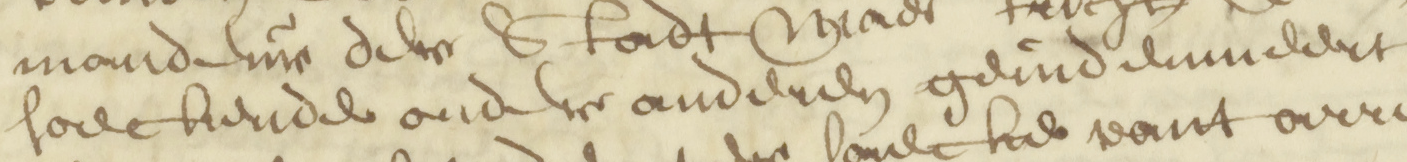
soeckende onder anderen geindemneert
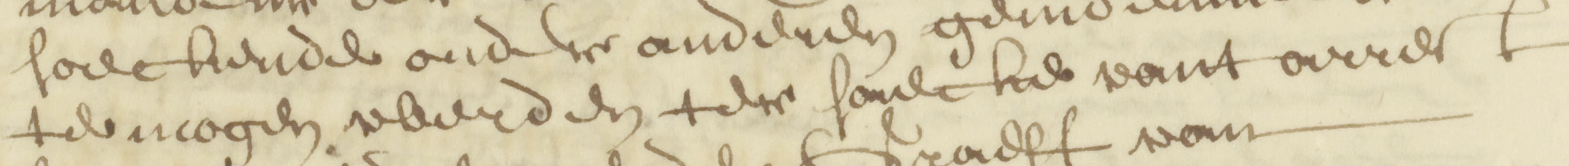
te mogen werden ter saecke vant arrest
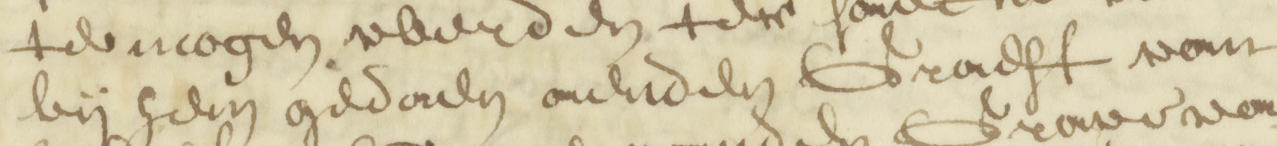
bij hem gedaen aenden Graeff van
